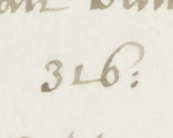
316:
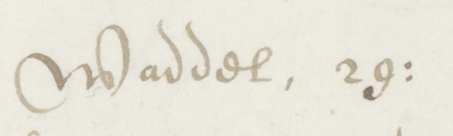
Waddel, 29:
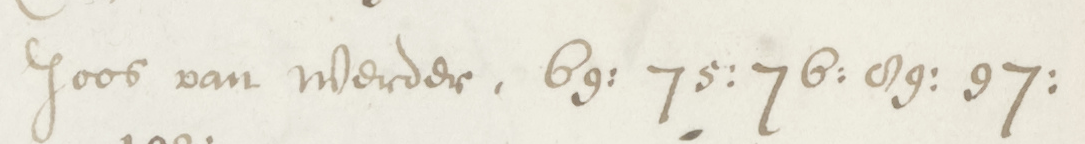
Joos van Werder, 69: 75: 76: 89: 97:
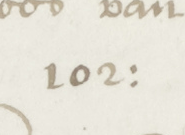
102:
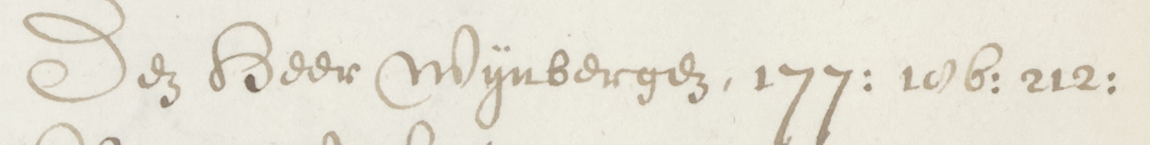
Den Heer Wijnbergen, 177: 186: 212:
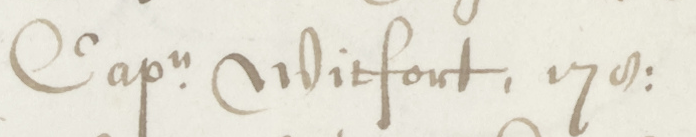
Capn. Witfort, 178:
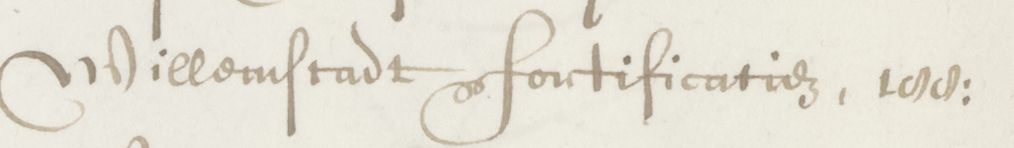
Willemstadt Fortificatien, 188:
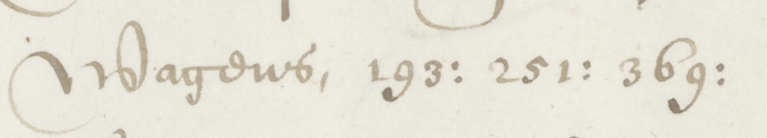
Wagens, 193: 251: 369:
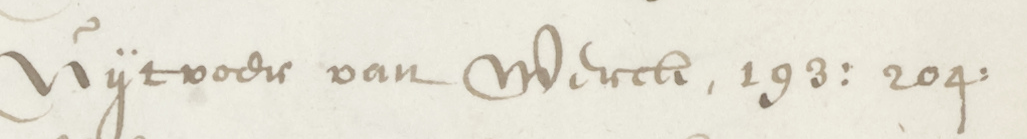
Uijtvoer van Werck, 193: 204:
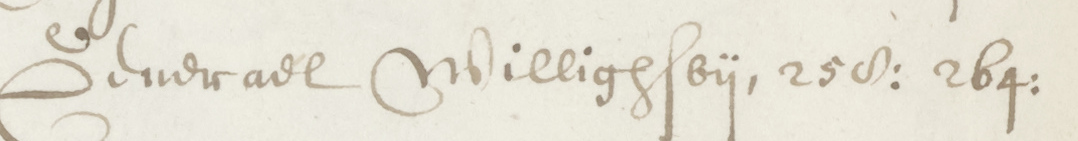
Generael Willighsbij, 258: 264:
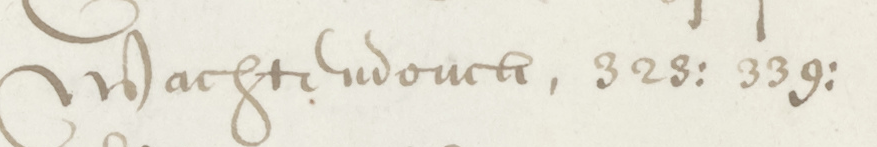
Wachtendonck, 323, 339:
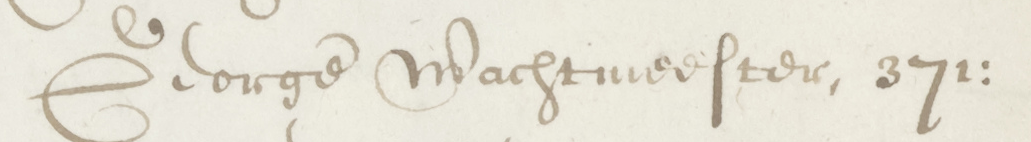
George Wachtmeester, 371:
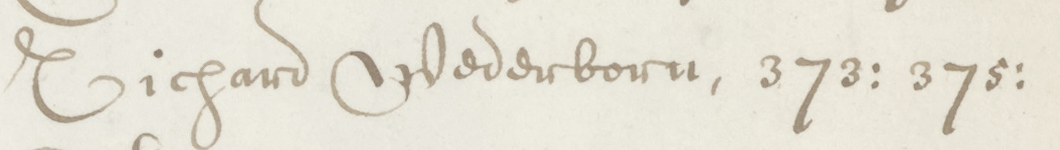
Richard Wederborn, 373: 375:
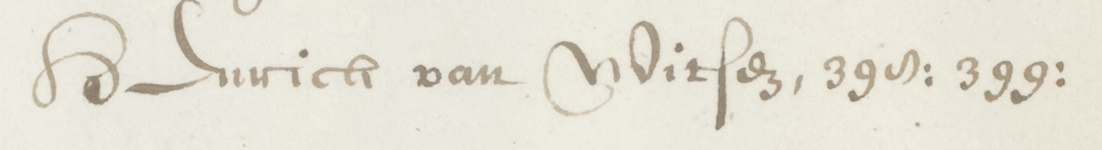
Henrick van Witsen, 398, 399:
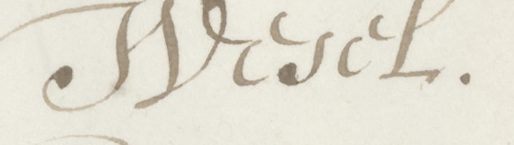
Wesel.
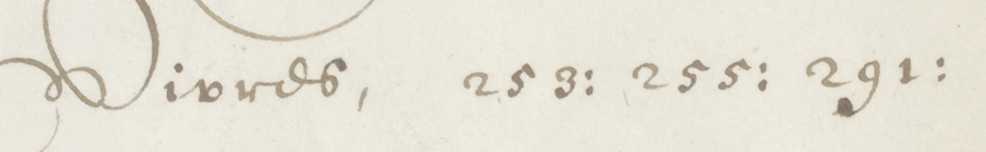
Vivres, 253: 255: 291:
